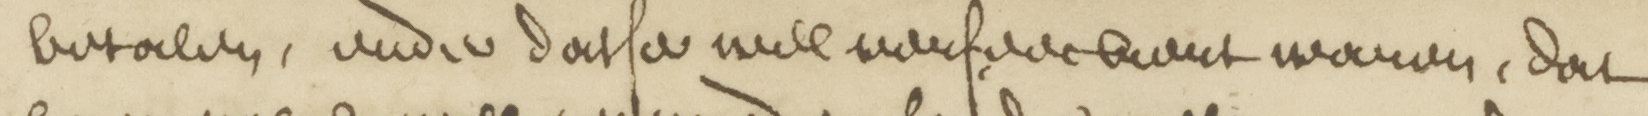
betalen, ende datse wel verseeckert waren, dat
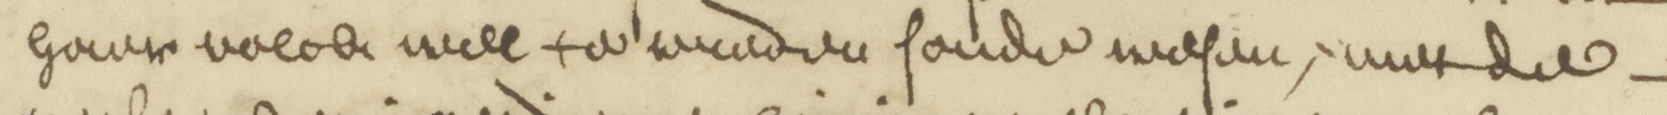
haer volck wel te vreden soude wesen, met de —
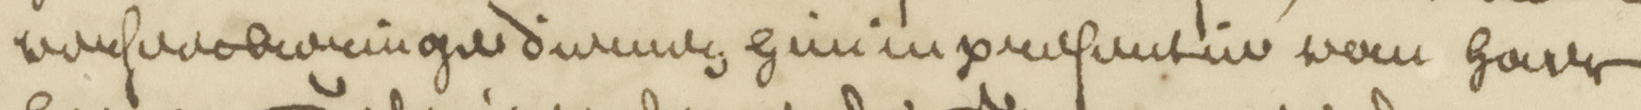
verseeckeringe diemen hun in presentie van haer
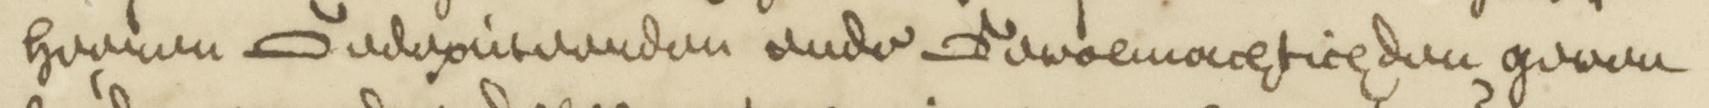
heeren Gedeputeerden ende Gevolmachtichden geven
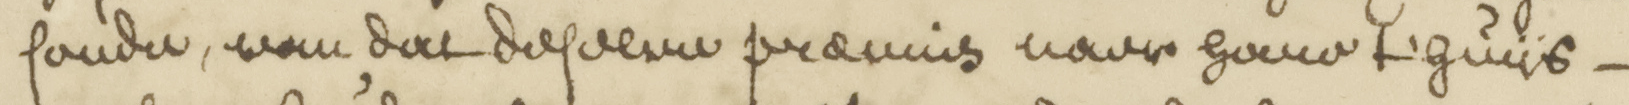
soude, van dat deselve premien naer hare t'huijs —
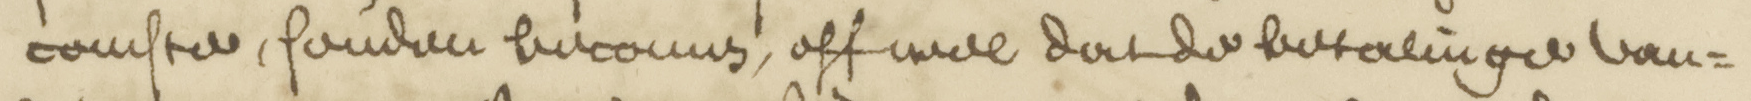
comste, souden becomen, off wel dat de betalinge van„
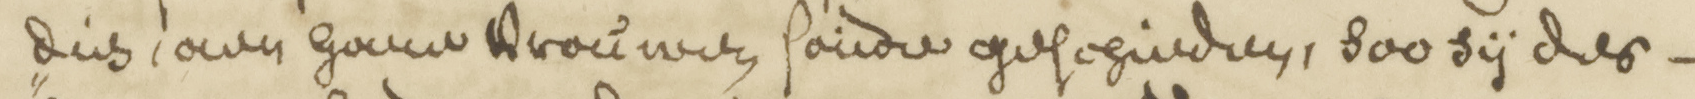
,,dien, aen hare vrouwen soude geschieden, soo sij des —
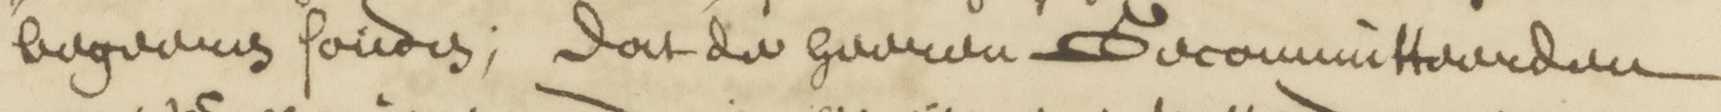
begeeren souden; dat de heeren Gecommitteerden
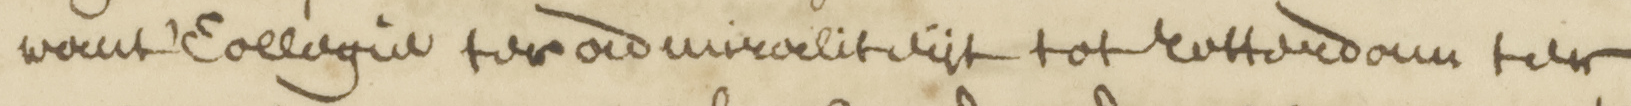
vant' Collegie ter admiraliteijt tot Rotterdam ter
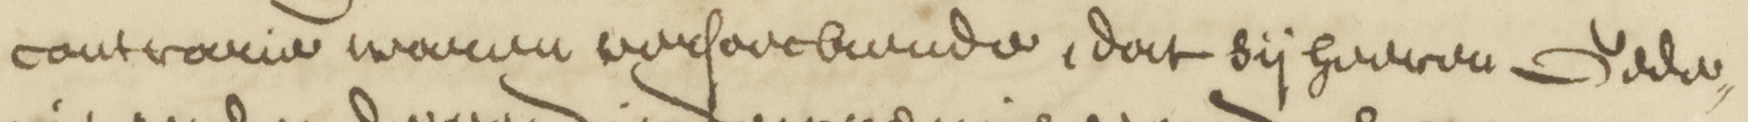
contrarie waren versoeckende, dat bij heeren Gede„
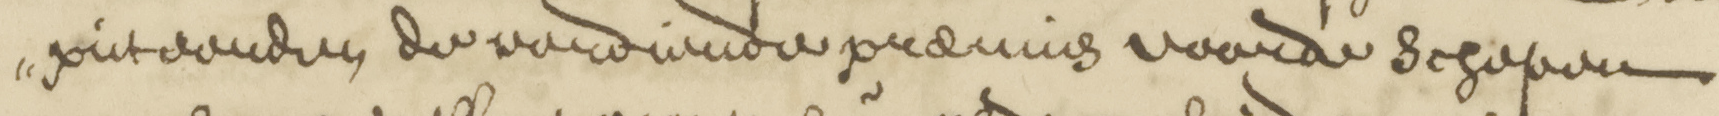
,,puteerden de verdiende premien voorde schepen
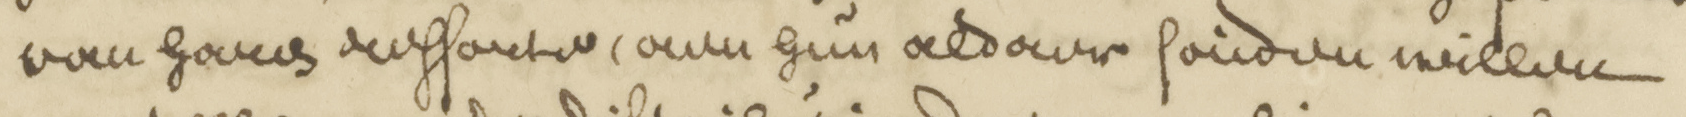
van haren ressorte, aen hun aldaer souden willen
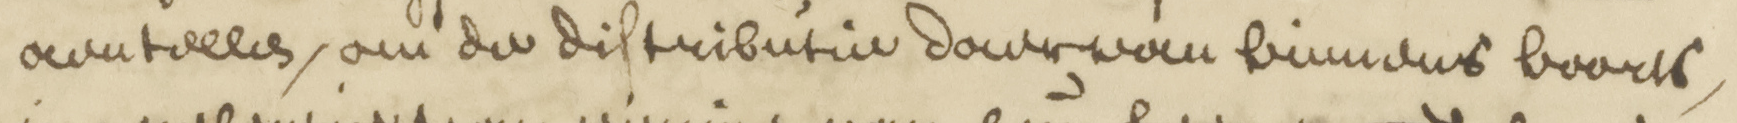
aentellen, om de distributie daervan binnens voorts,
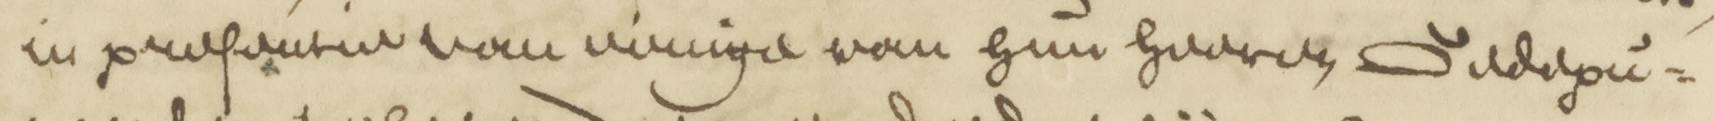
in presentie van eenige van hun heeren Gedepu„
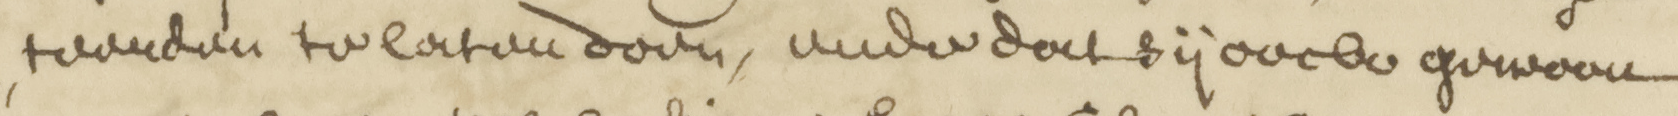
,,teerden te laten doen, ende dat sij oock gewoon
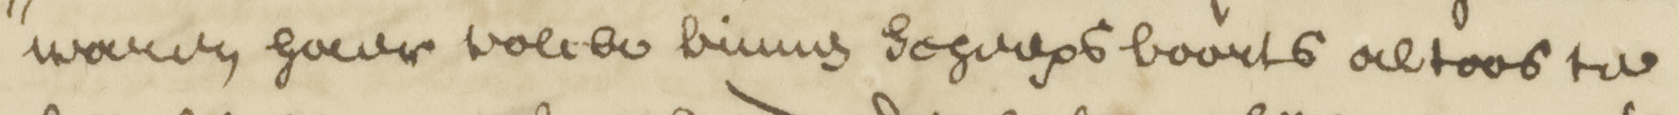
waren haer volck binnen Scheeps boorts altoos te
